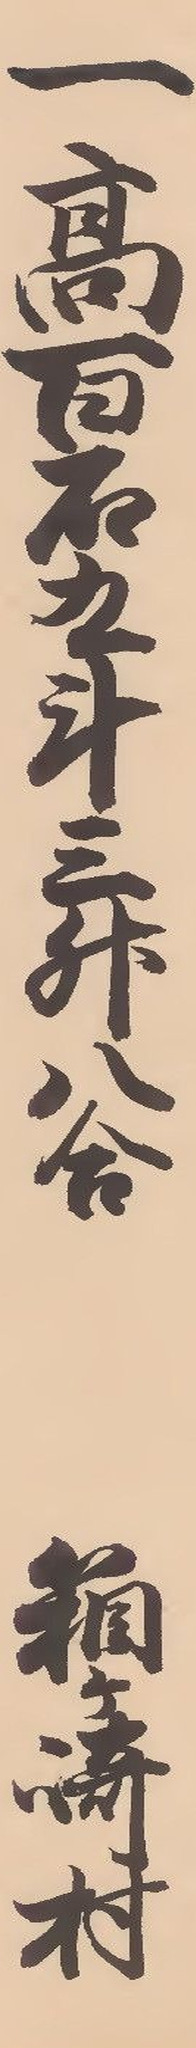一高百石九斗三升八合箱ヶ崎村
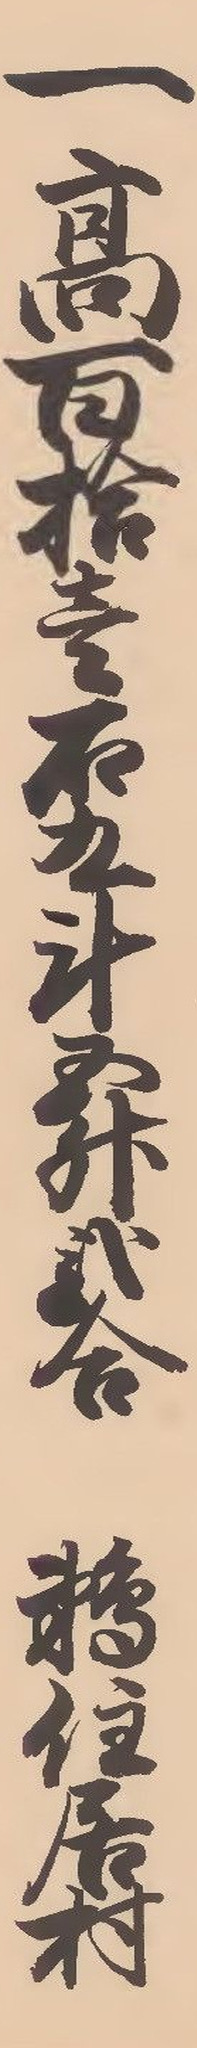一高百拾壱石九斗五升弐合鵜住居村

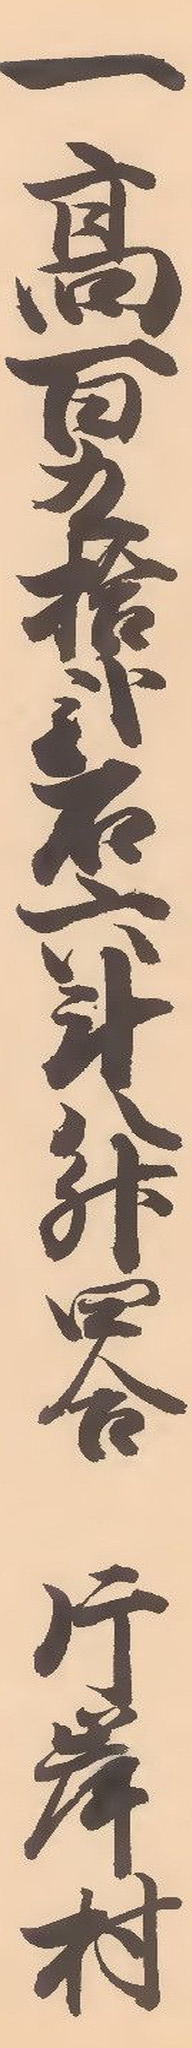一高百九拾弐石六斗八升四合片岸村
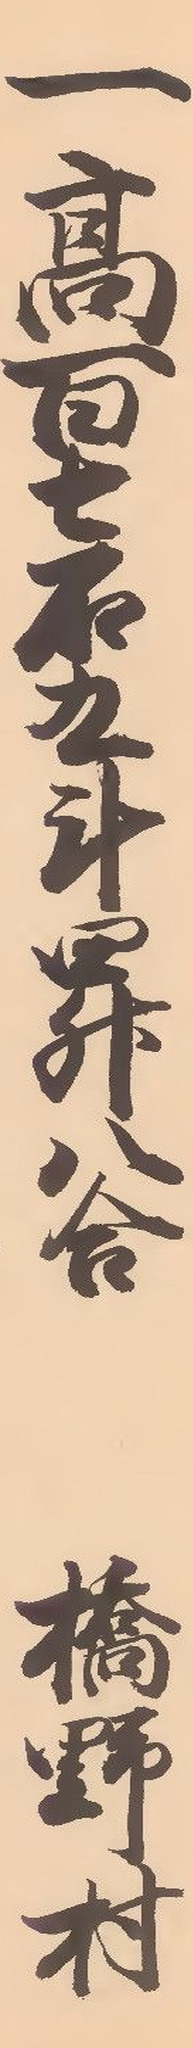一高百七石九斗四升八合橋野村
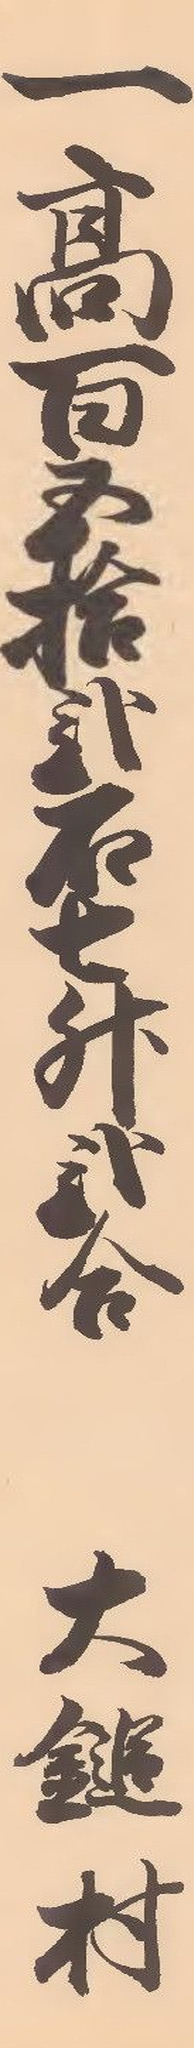一高百五拾弐石七升弐合大鎚村
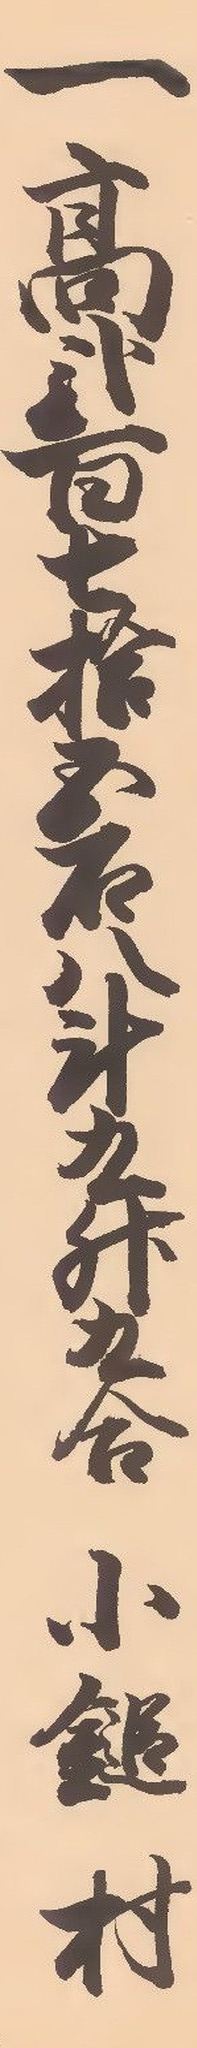一高弐百七拾五石八斗九升九合小鎚村
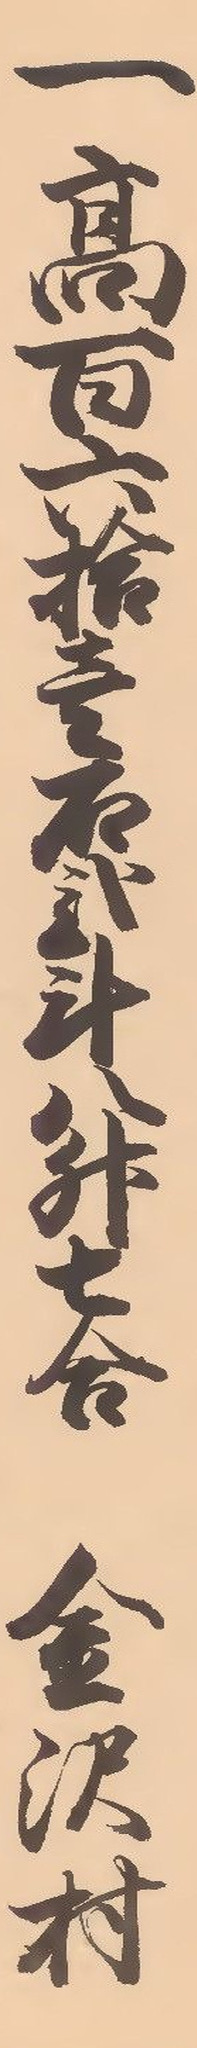一高百六拾壱石弐斗八升七合金沢村
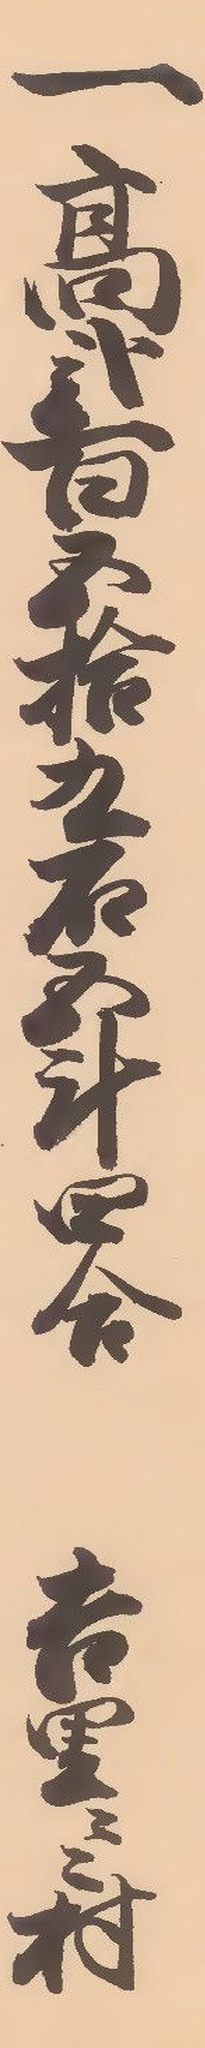一高弐百五拾九石五斗四合吉里々々村
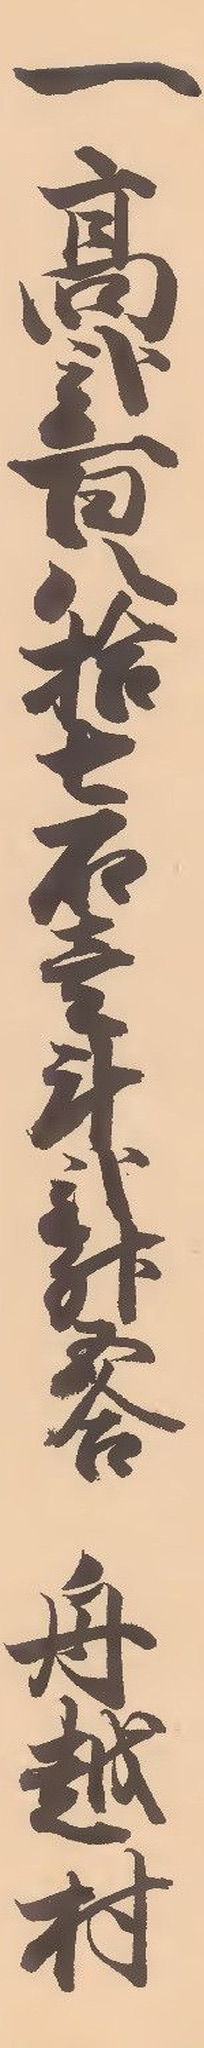一高弐百八拾七石壱斗弐升五合舟越村
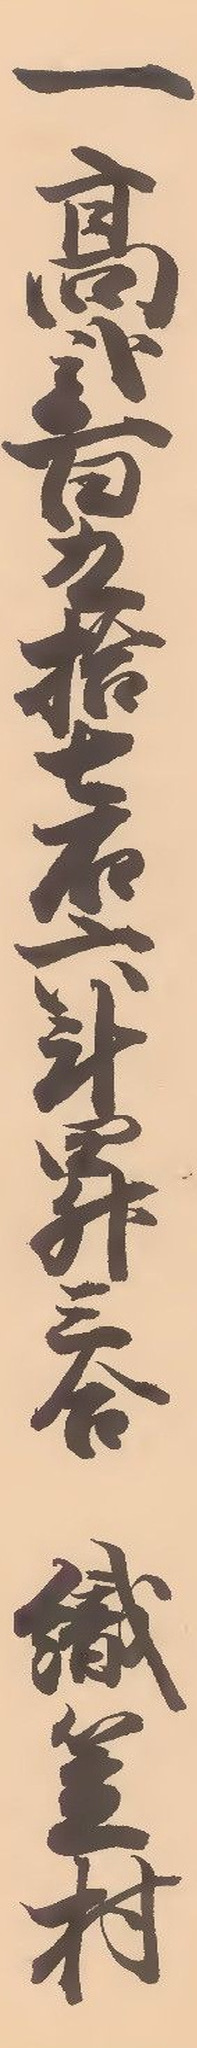一高弐百九拾七石六斗四升三合織笠村

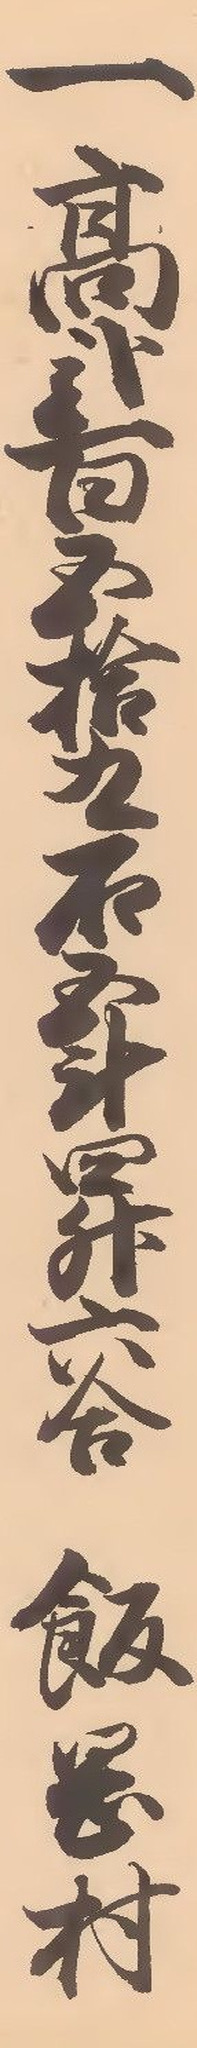一高弐百五拾九石五斗四升六合飯岡村
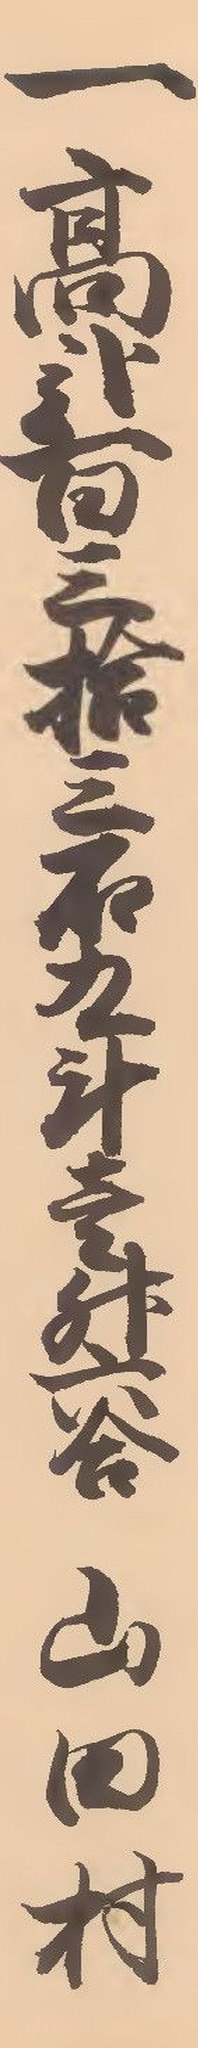一高弐百三拾三石九斗壱升六合山田村
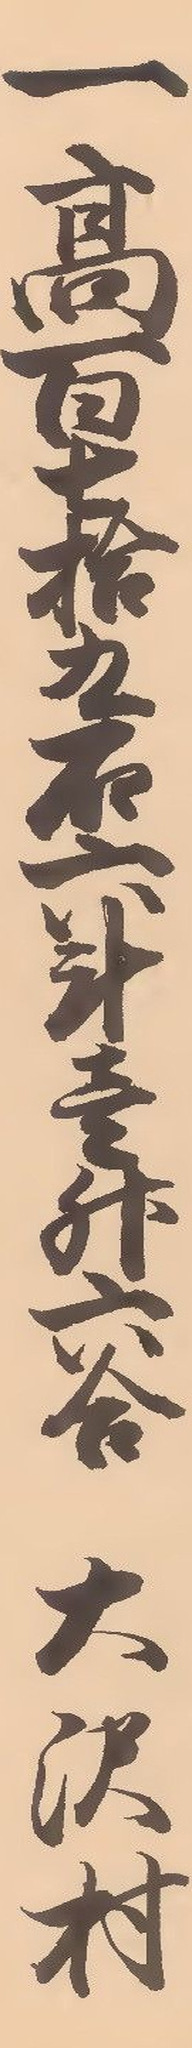一高百七拾九石六斗壱升六合大沢村
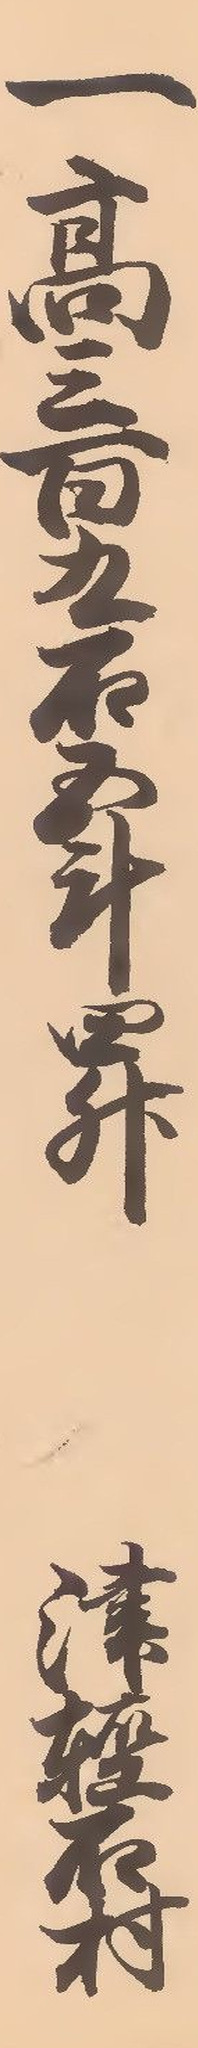一高三百九石五斗四升津軽石村
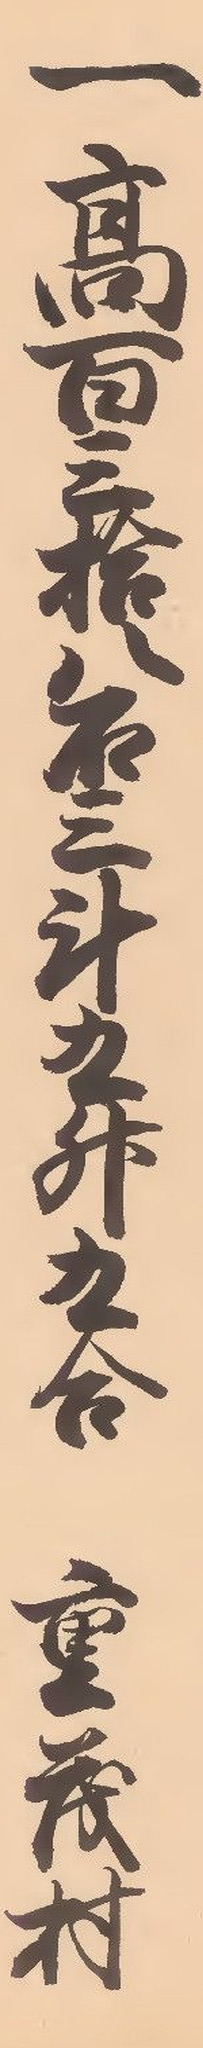一高百三拾八石三斗九升九合重茂村
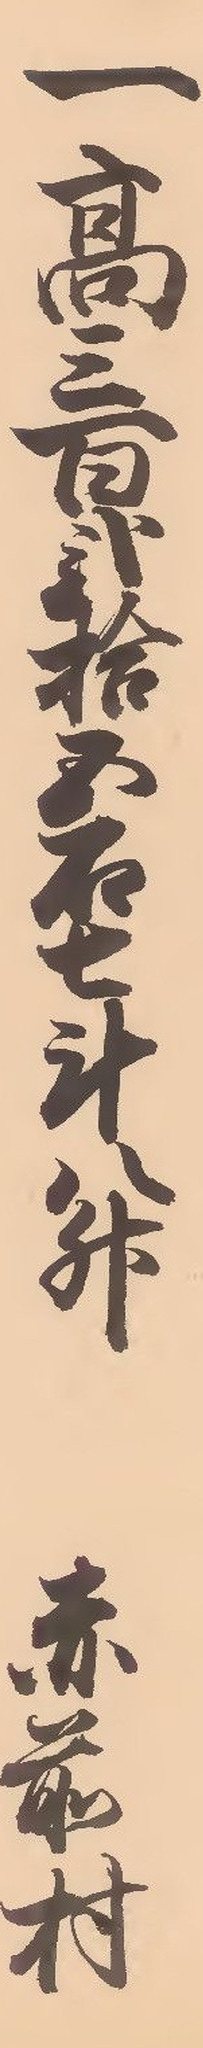一高三百弐拾五石七斗八升赤前村
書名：陸奥国郷帳　６
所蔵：国立公文書館 National Archives of Japan
